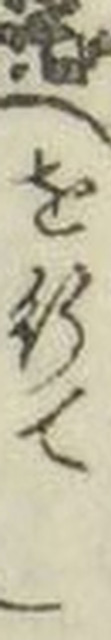を行て
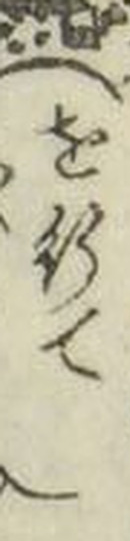を行て
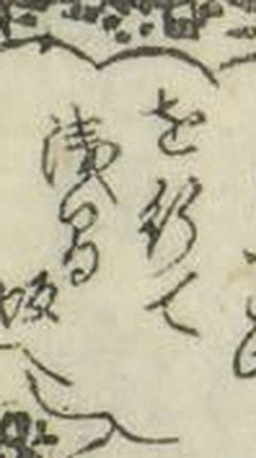浅間坂へ
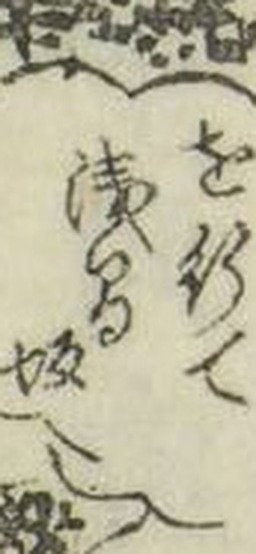浅間坂へ

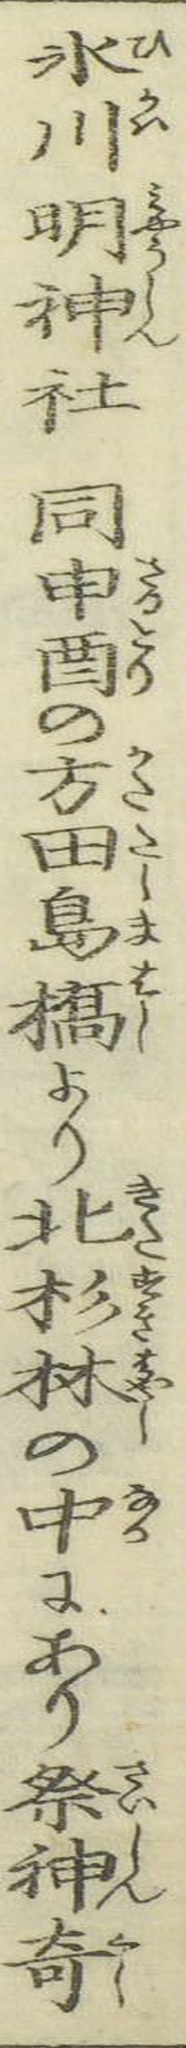氷川明神社同申酉の方田島橋より北杉林の中にあり祭神奇
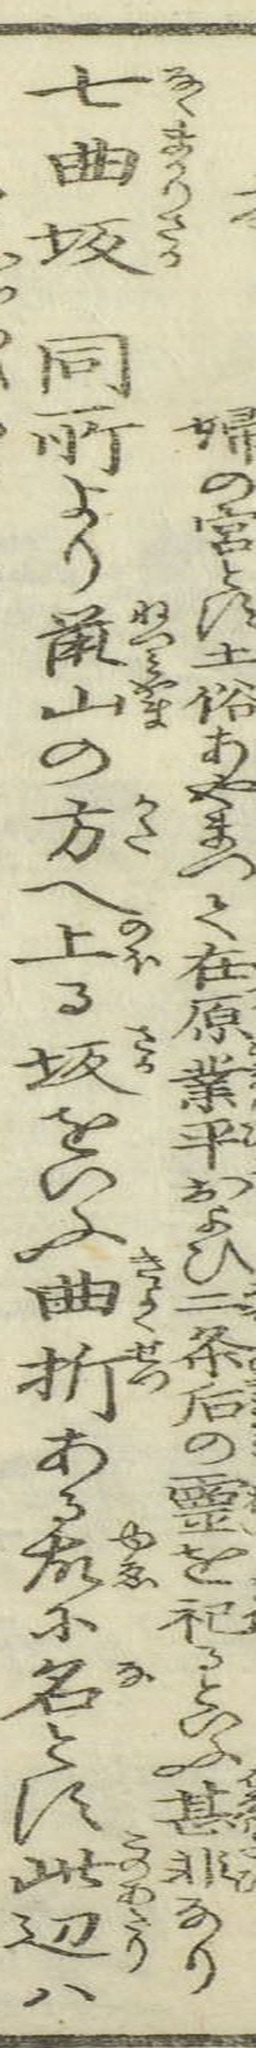七曲坂同所より鼠山の方へ上る坂をいふ曲折ある故に名とす此辺は
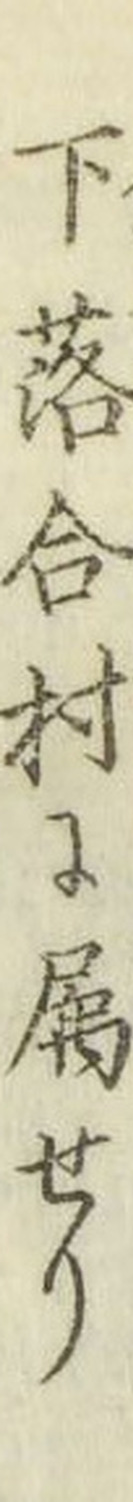下落合村に属せり
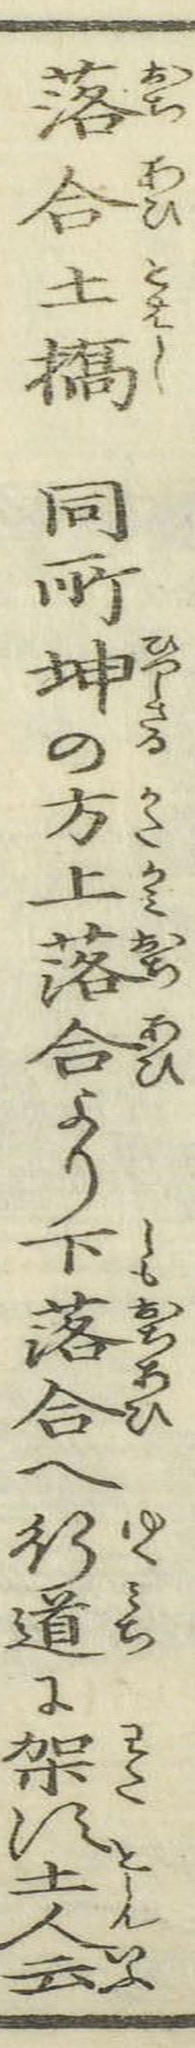落合土橋同所坤の方上落合より下落合へ行道に架す土人云
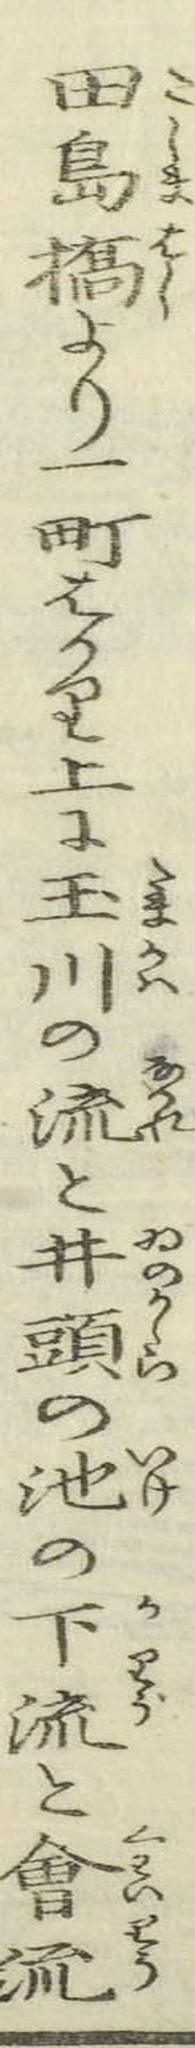田島橋より一町はかり上に玉川の流と井頭の池の下流と會流
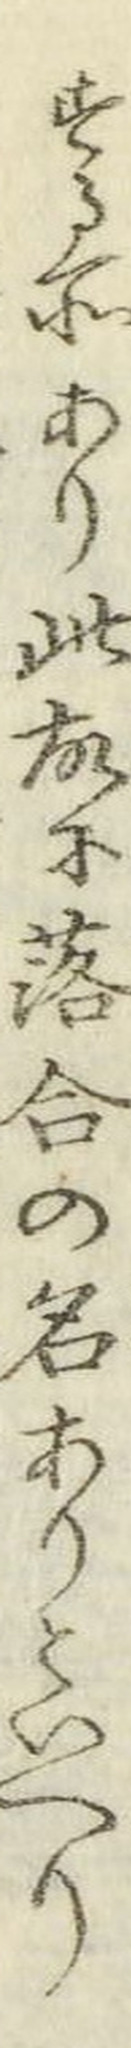する所あり此故に落合の名ありといへり
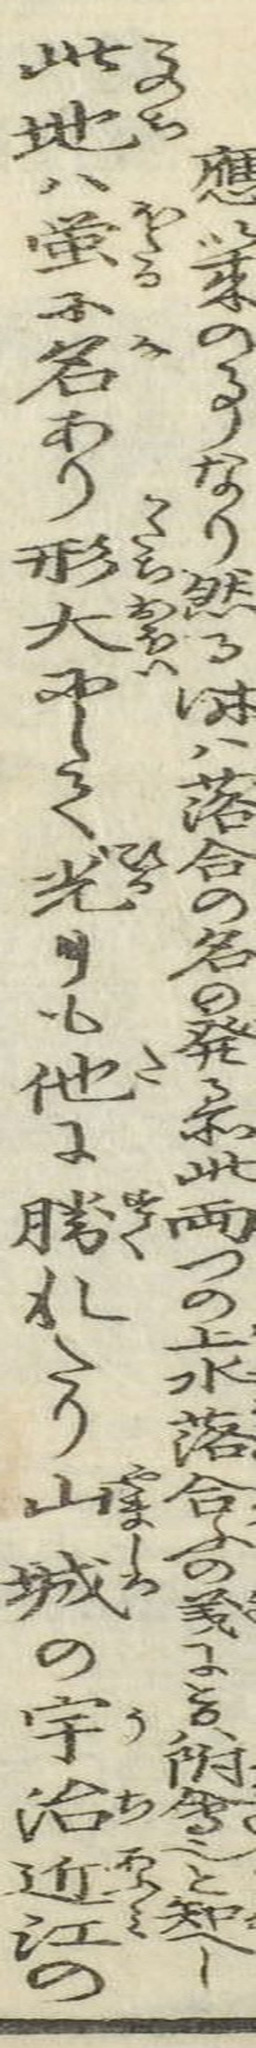此地は蛍に名あり形大にして光りも他に勝れたり山城の宇治近江の
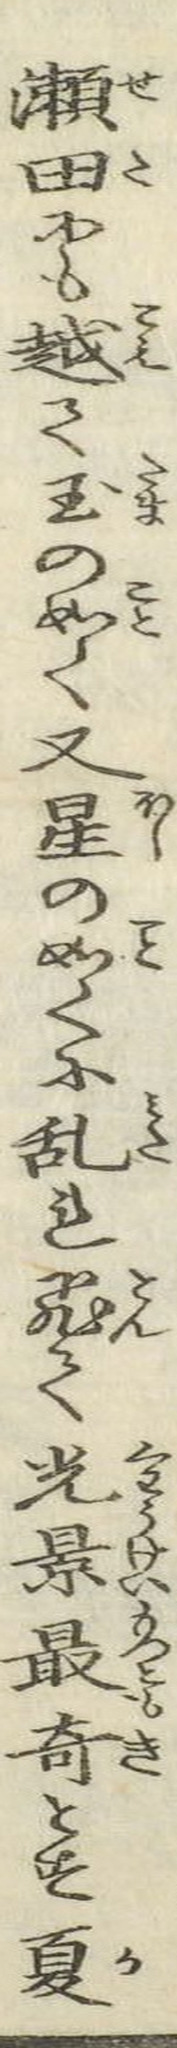瀬田にも越て玉の如く又星の如くに乱れ飛て光景最奇とす夏
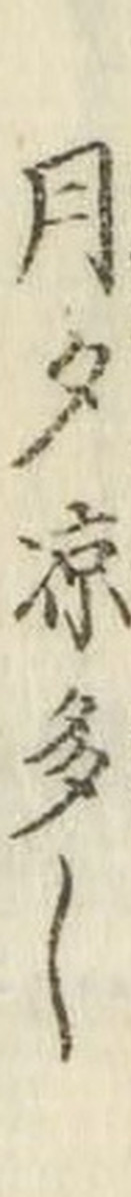月夕涼多し
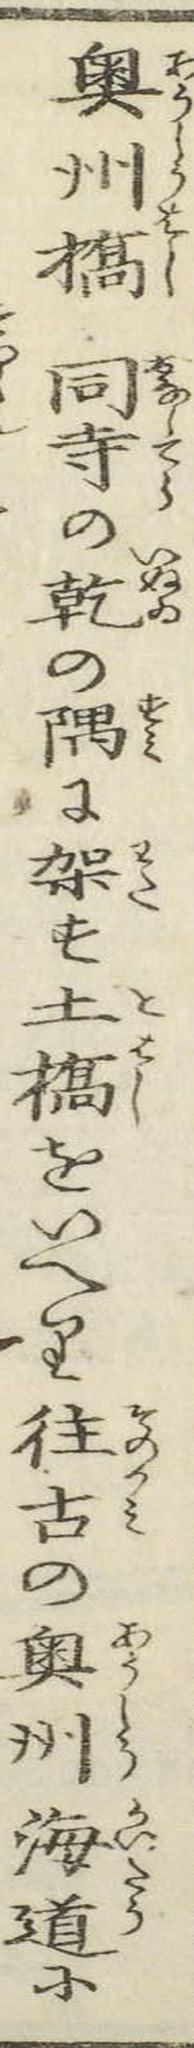奥州橋同寺の乾の隅に架す土橋をいへり往古の奥州海道に
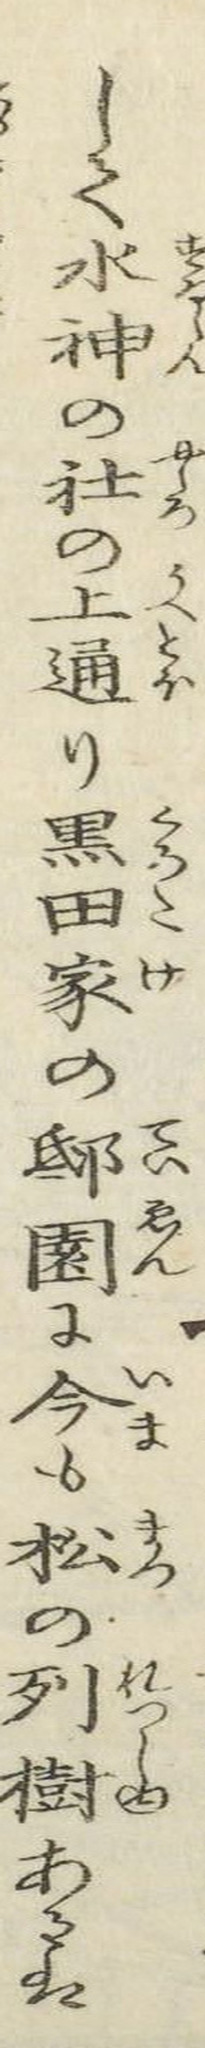して水神の社の上通り黒田家の邸園に今も松の列樹あるは
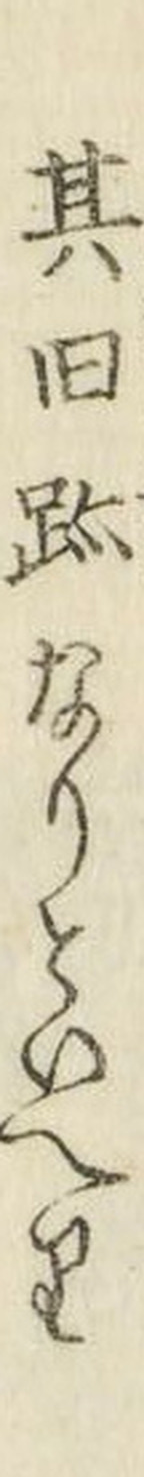其旧跡なりといへり
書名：江戸名所図会 20巻 巻之12
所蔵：東京学芸大学教育コンテンツアーカイブ
